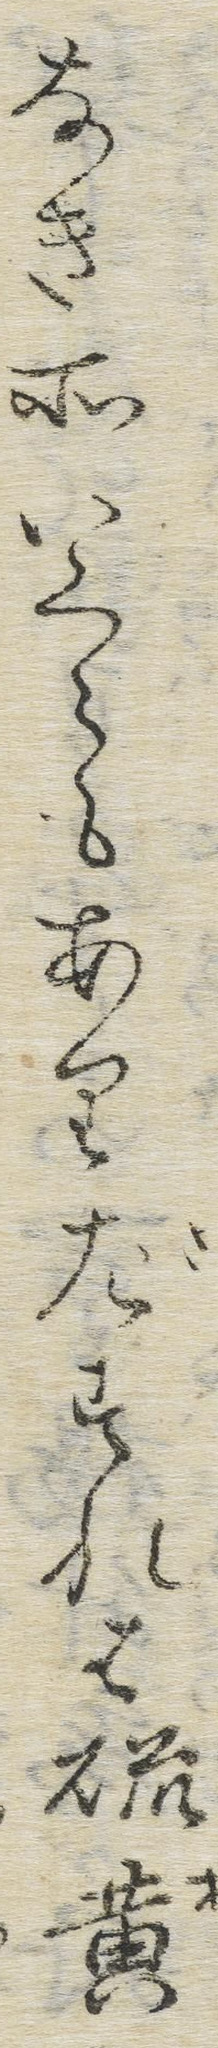なき所いくらもあり左すれは硫黄
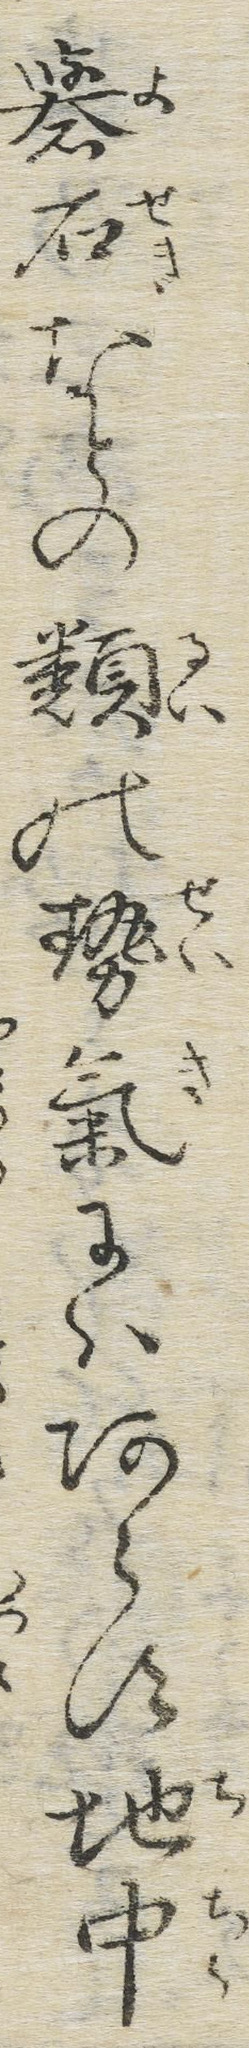礜石なとの類の勢気にはあらす地中
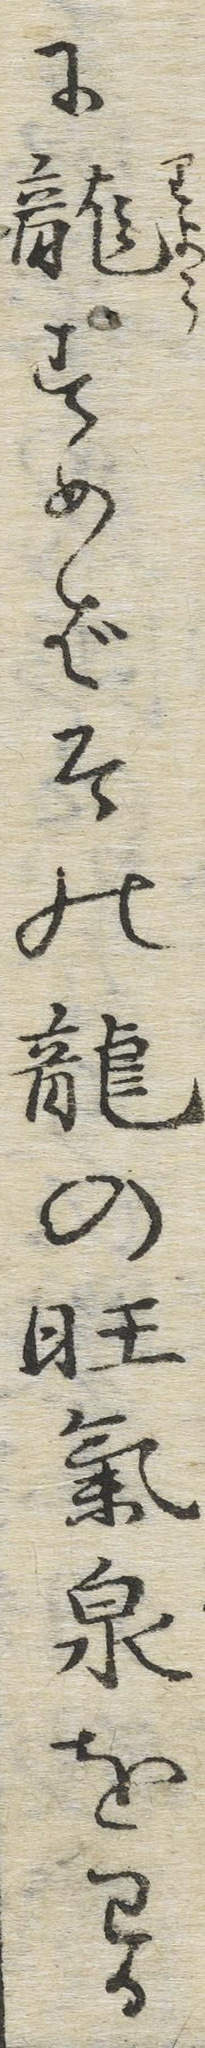に龍すめばその龍の旺気泉をわか
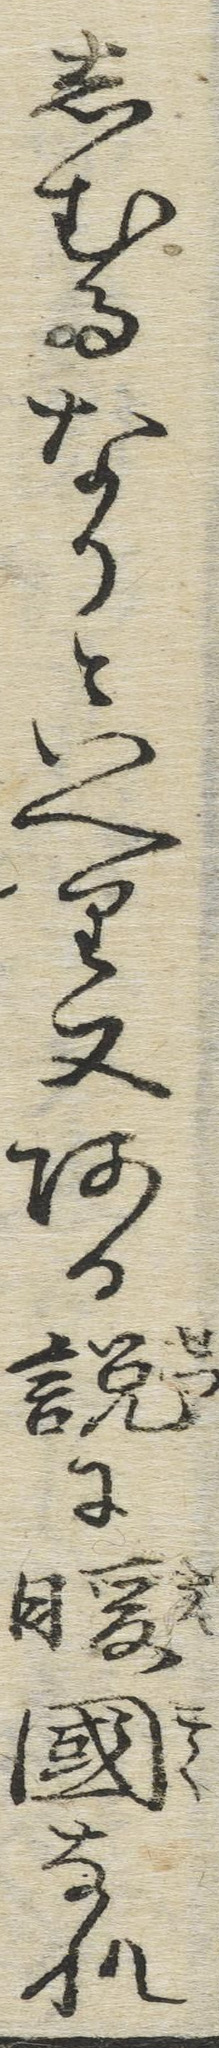しむるなりといへり又ある説に暖国なれ
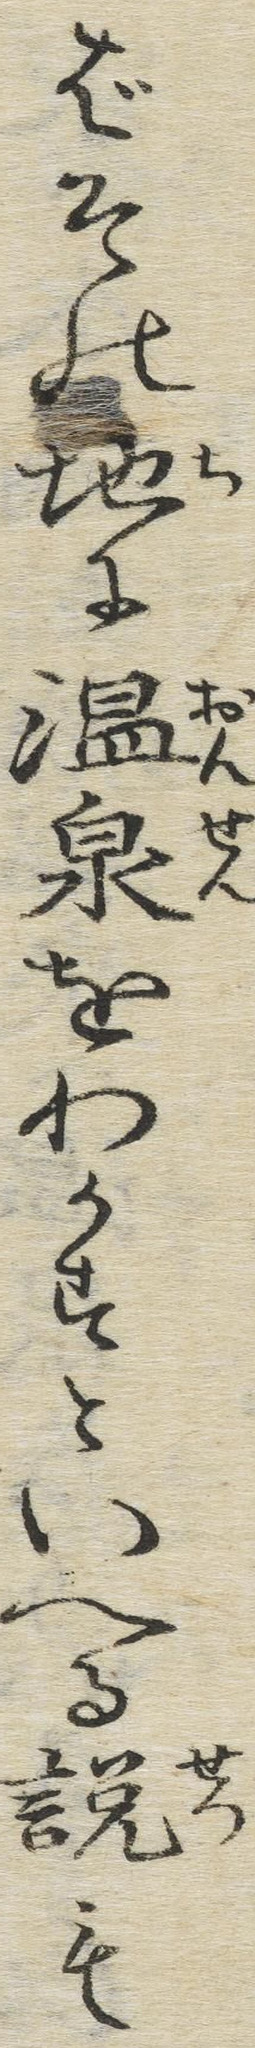ばその地に温泉をわかすといへる説も
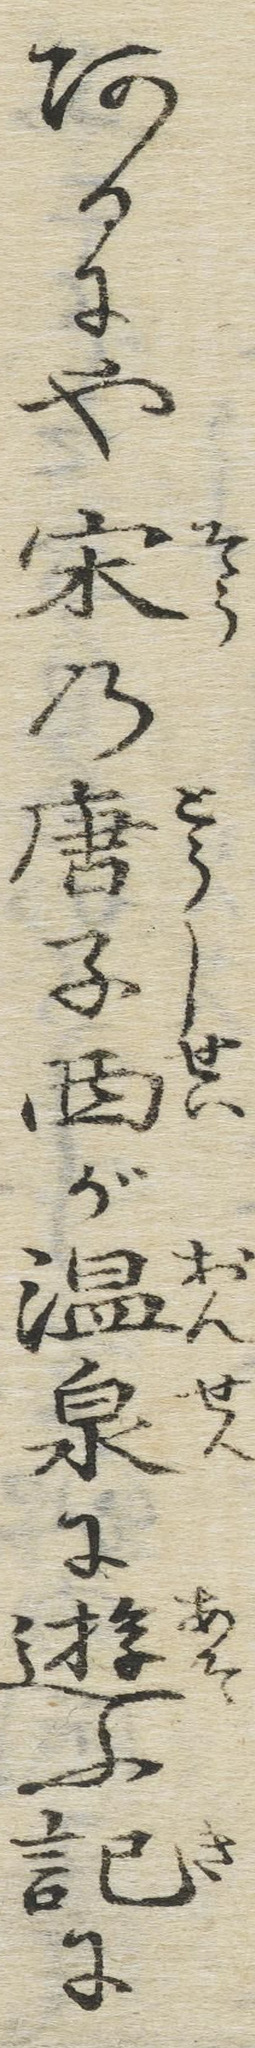あるにや宋の唐子西が温泉に遊ふ記に
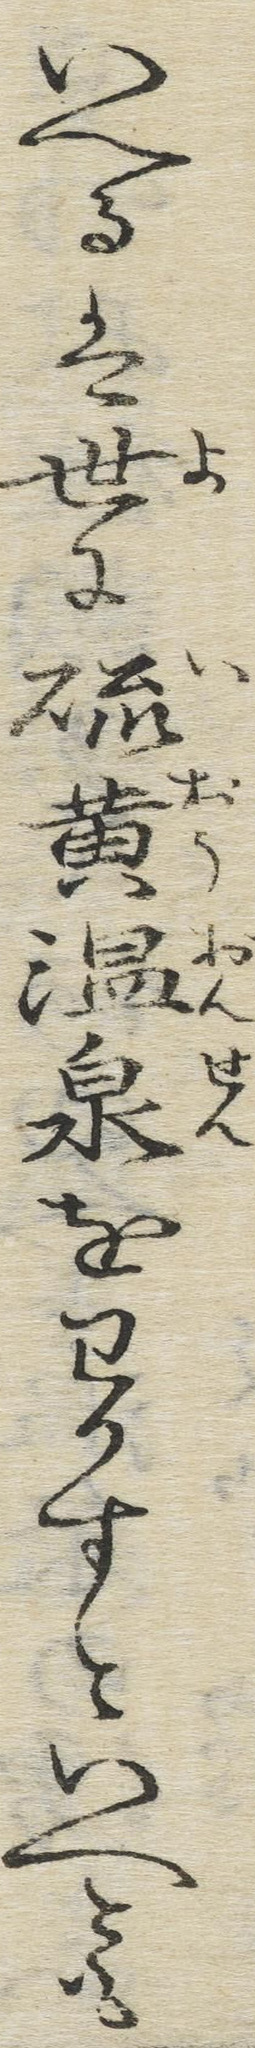いへるは世に硫黄温泉をわかすといへとも
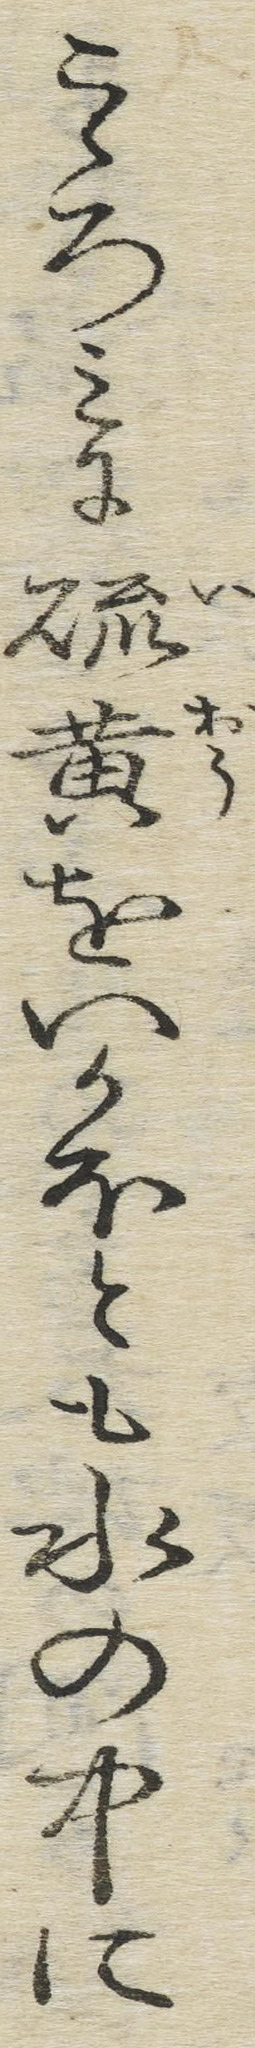こゝろみに硫黄をいかほとも水の中に
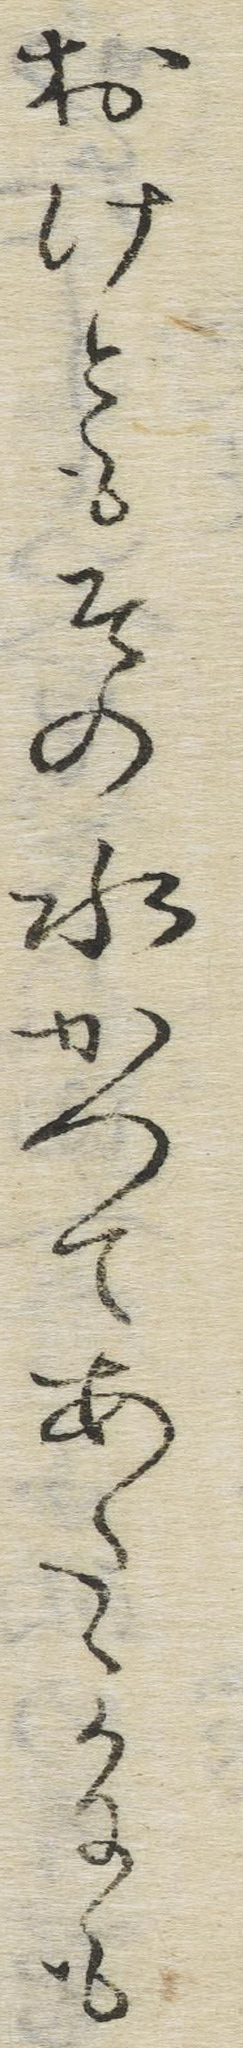おけともその水かつてあたゝかにも
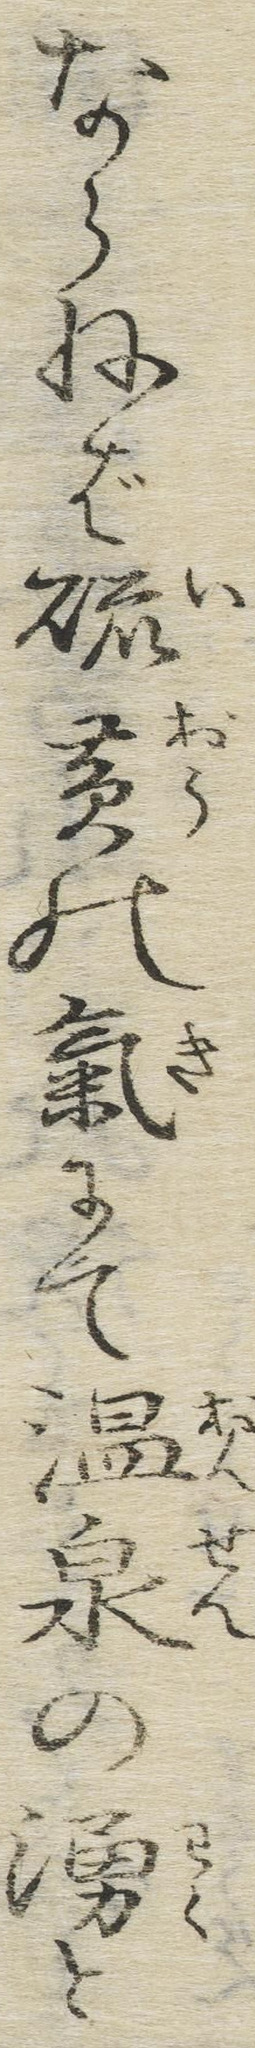ならねば硫黄の気にて温泉の湧と
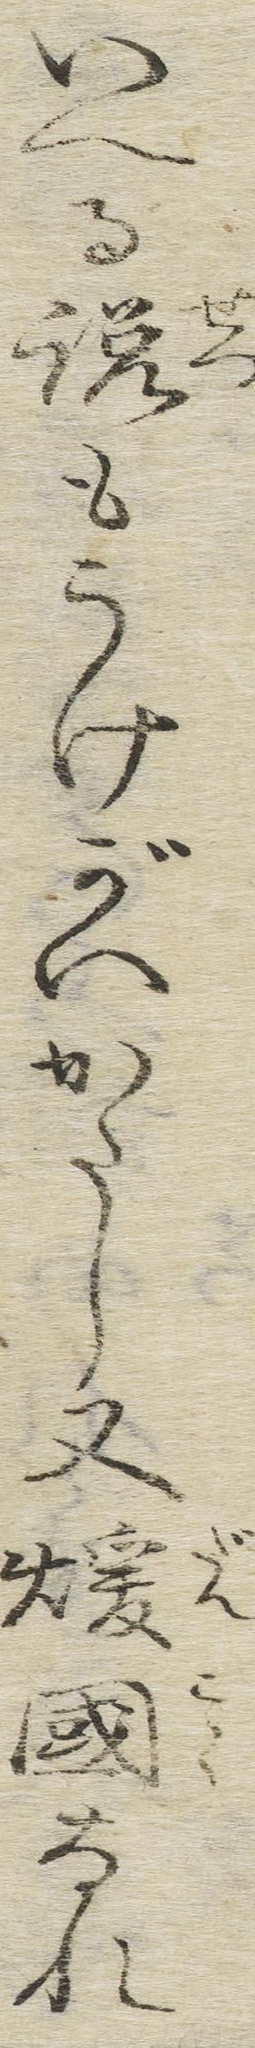いへる説もうけがいかたし又煖国なれ

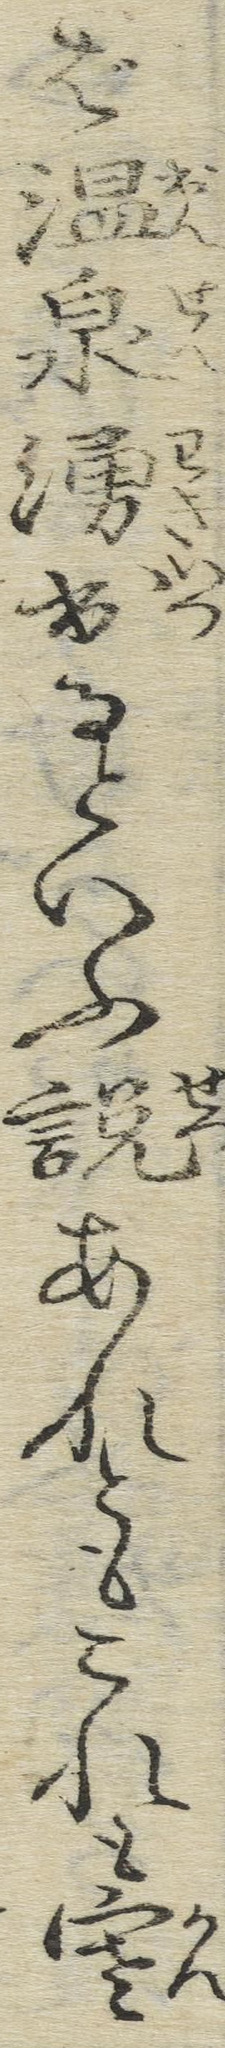ば温泉湧出るといふ説あれともこれも寒
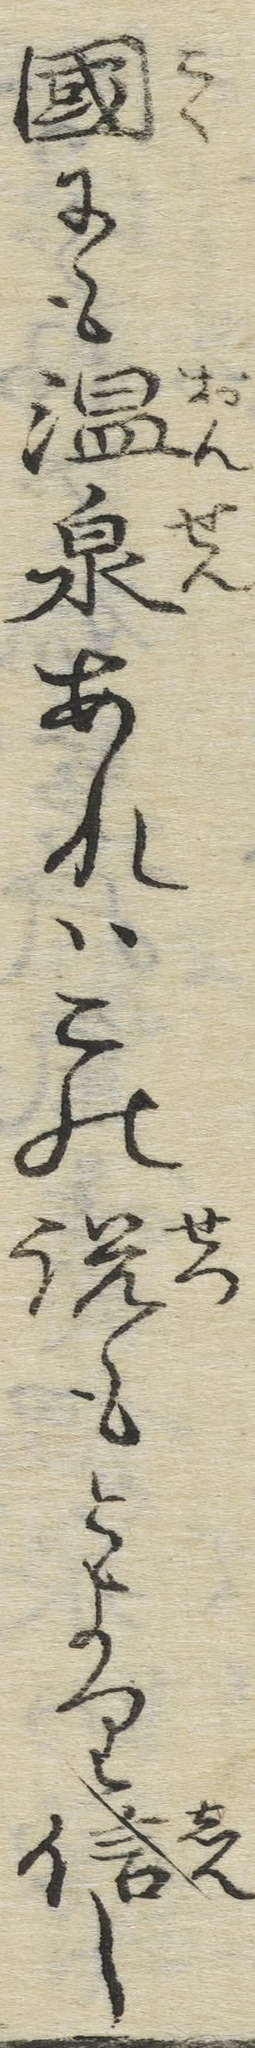国にも温泉あれはこの説もとより信し
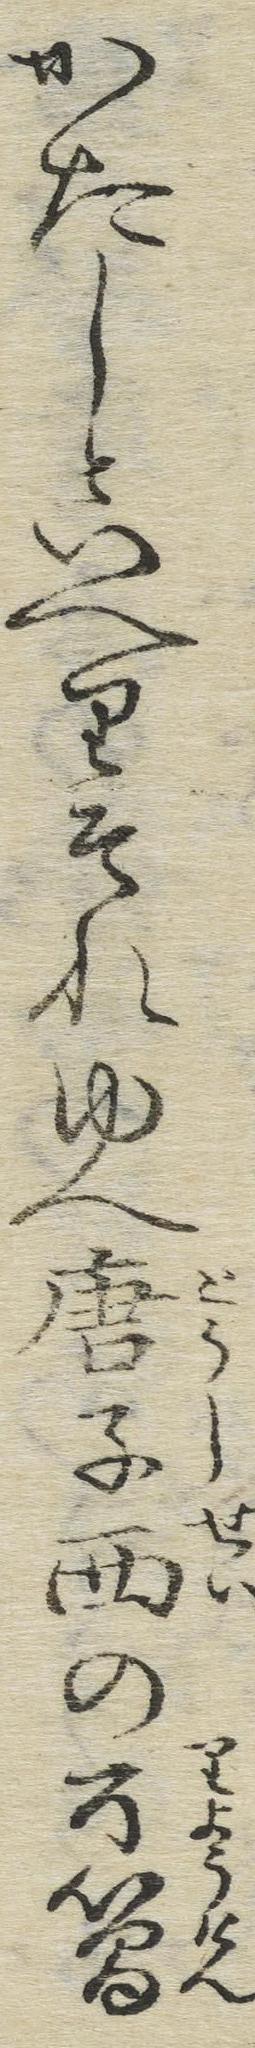かたしといへりそれゆへ唐子西の了簡
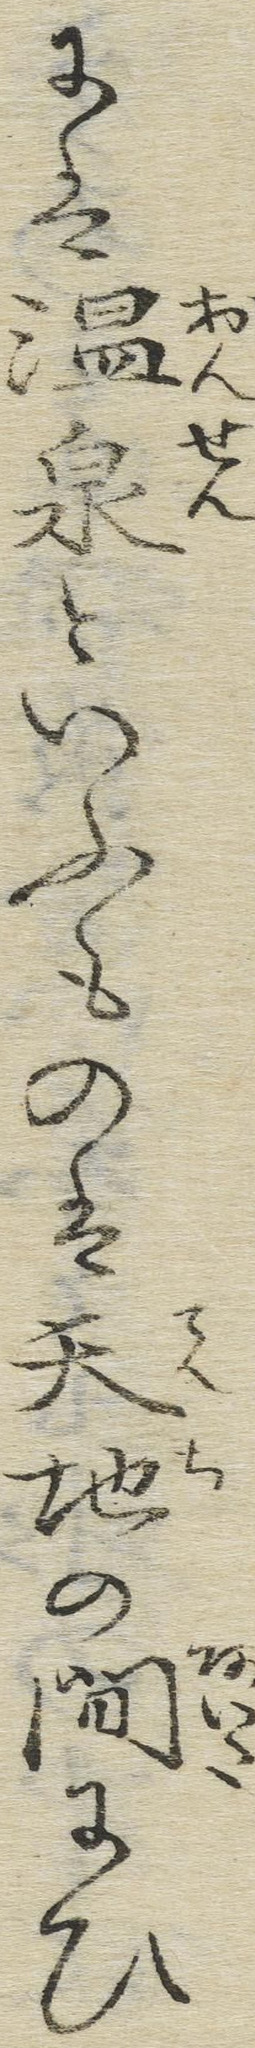には温泉といふものは天地の間にひ
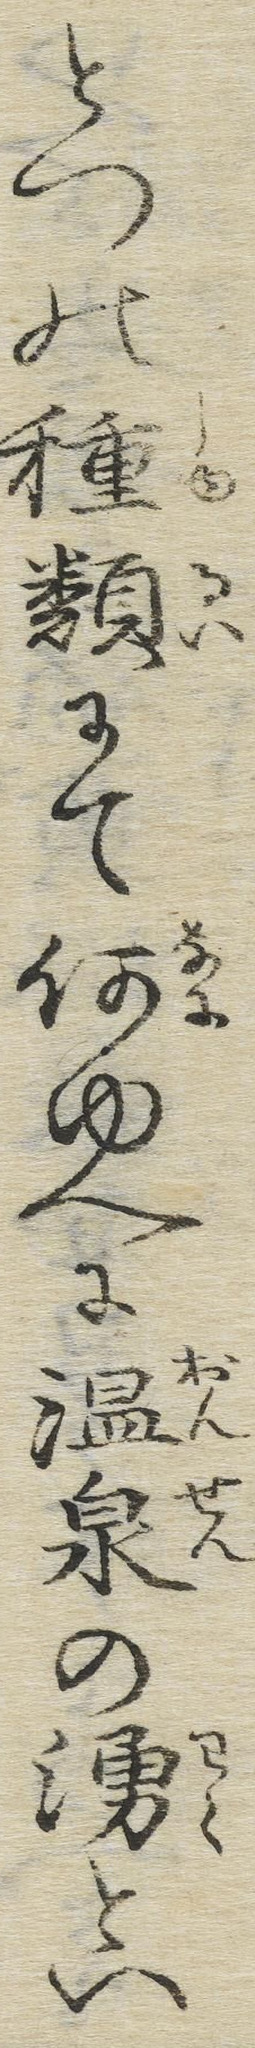とつの種類にて何ゆへに温泉の湧とい
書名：温泉考
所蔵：東京大学地震研究所図書室 Earthquake Research Institute Library, The University of Tokyo, JAPAN
